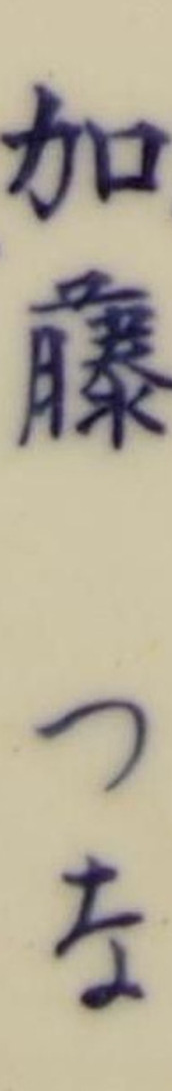加藤つな
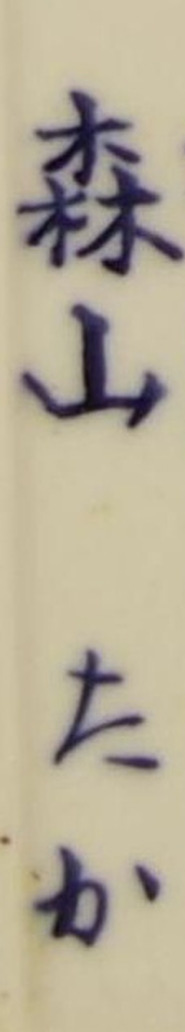森山たか

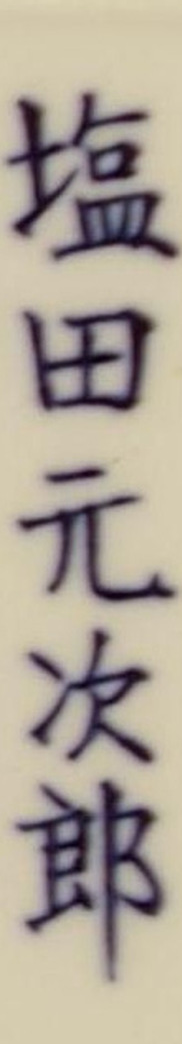塩田元次郎
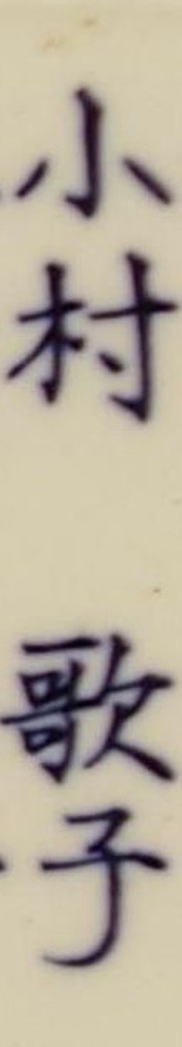小村歌子
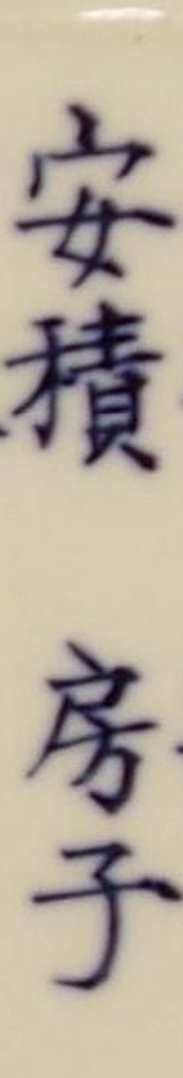安積房子
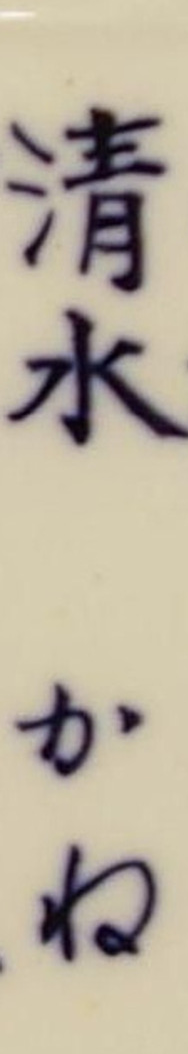清水かね
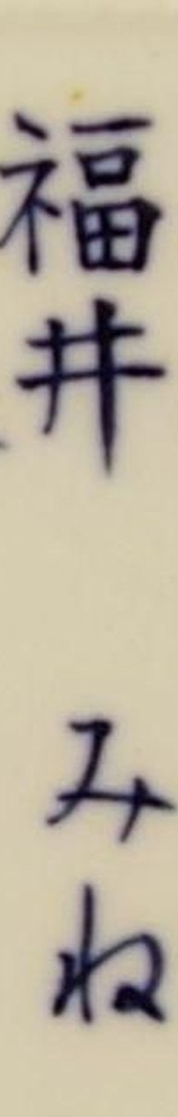福井みね
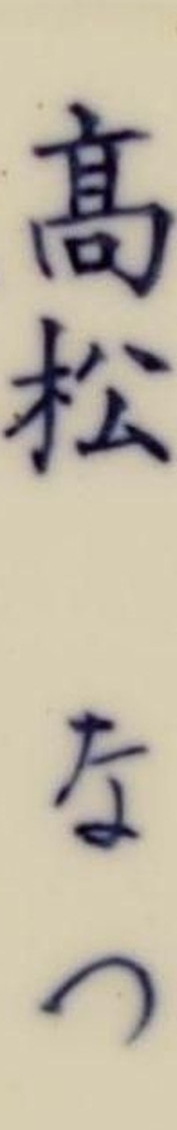高松なつ
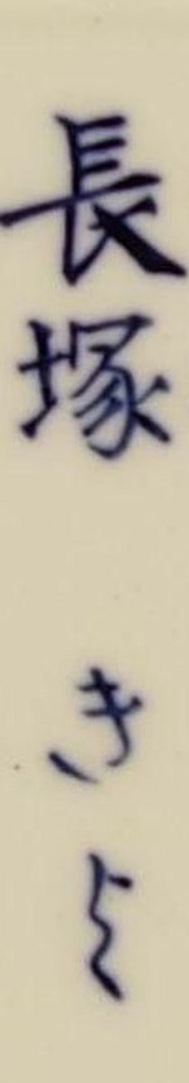長塚きよ
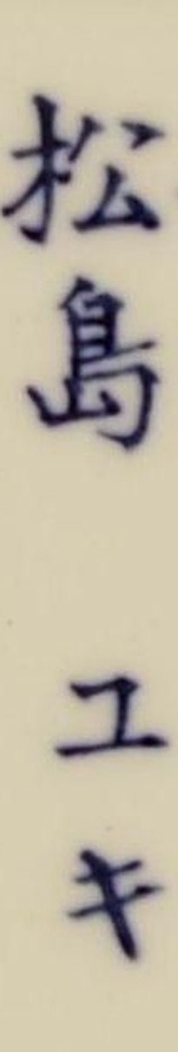松島ユキ
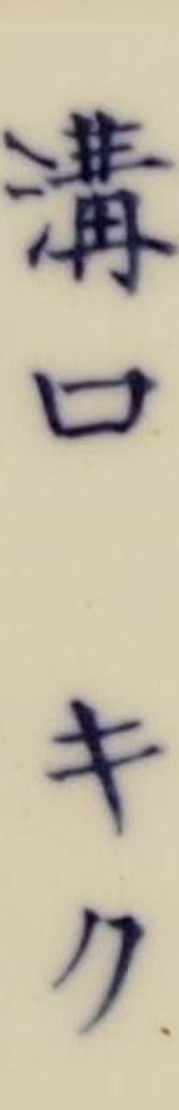溝口キク
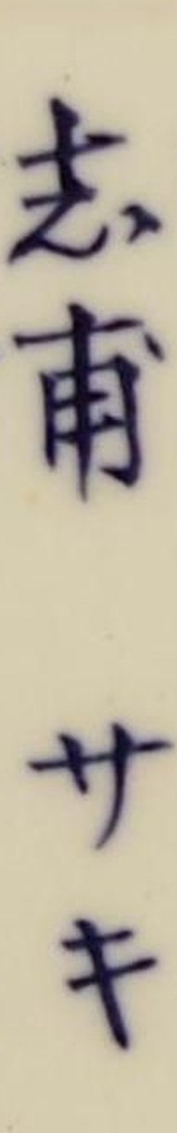志甫サキ
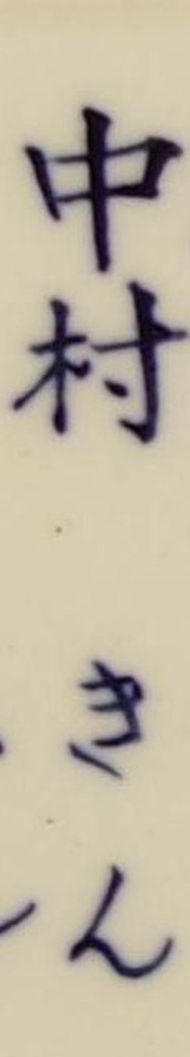中村きん
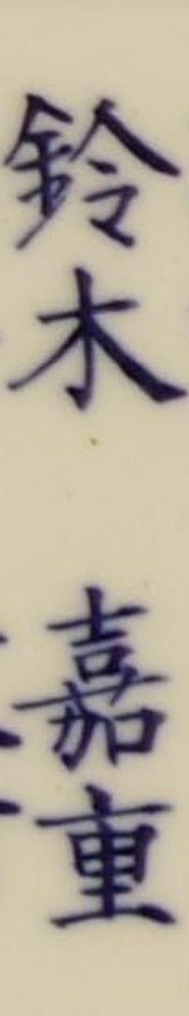鈴木嘉重
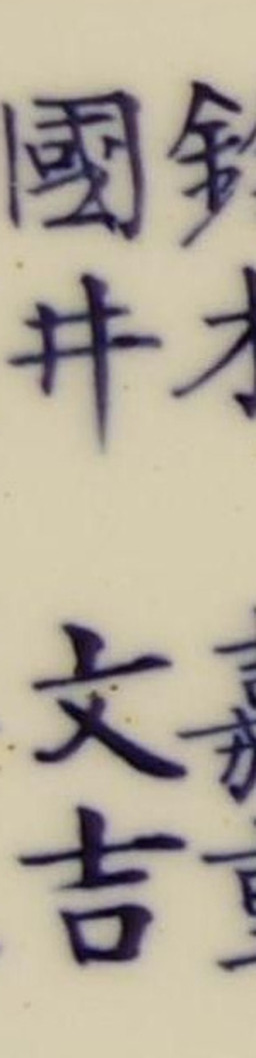國井文吉
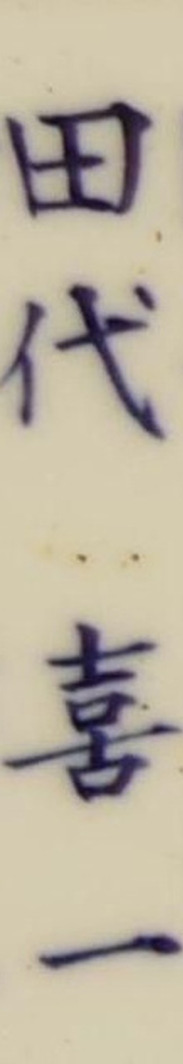田代喜一
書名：E~L
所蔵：高野山金剛峯寺
